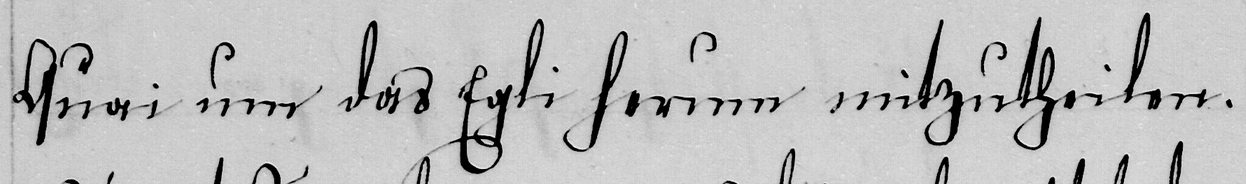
Quai um das Egli herum mitzutheilen.
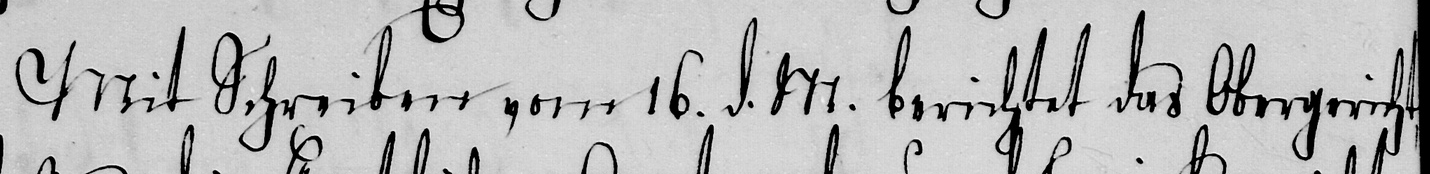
Mit Schreiben vom 16. d. M. berichtet das Obergerich¬
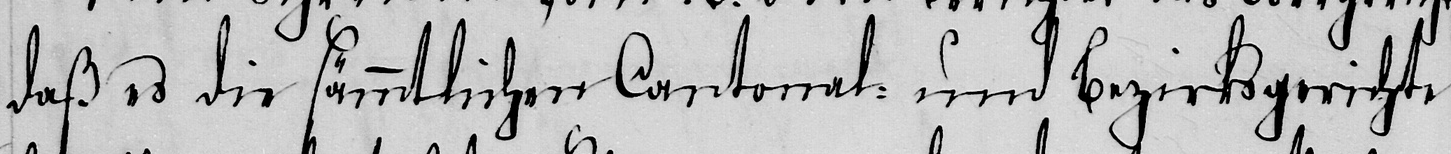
daß es die sämmtlichen Cantonal- und Bezirksgerichte
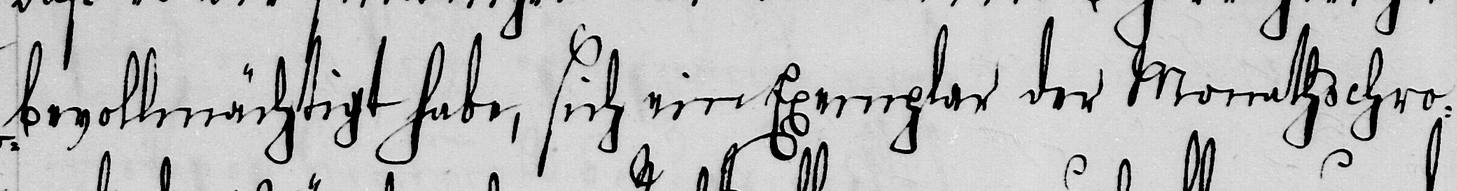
bevollmächtigt habe, sich ein Exemplar der Monathschro¬
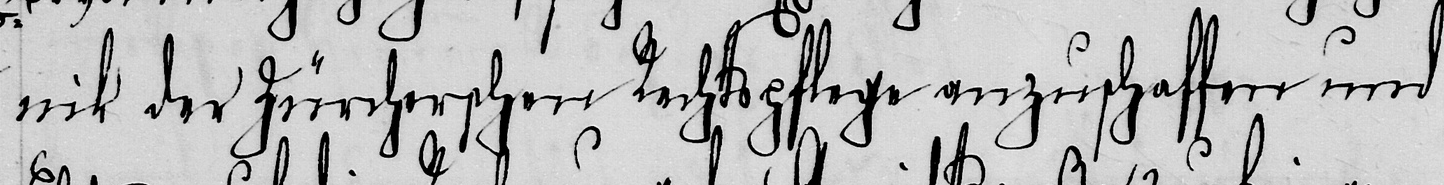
nik der Zürcherschen Rechtspflege anzuschaffen und
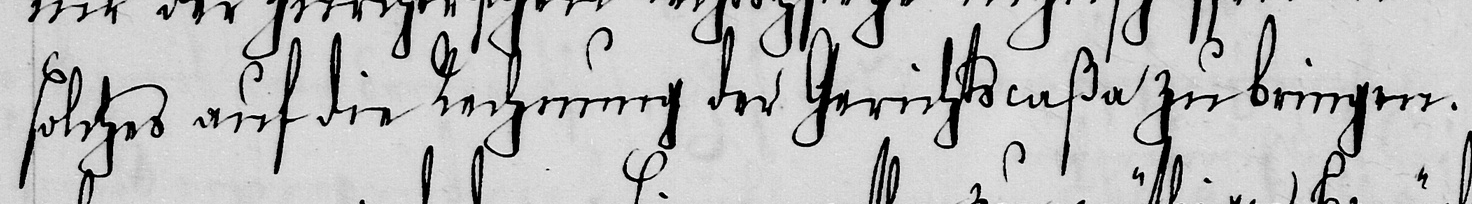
solches auf die Regierung der Gerichtscaßa zu bringen.
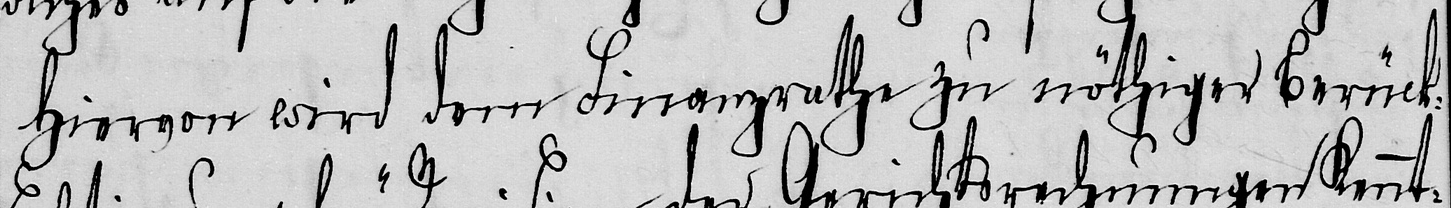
Hiervon wird dem Finanzrathe zu nöthiger Berück¬
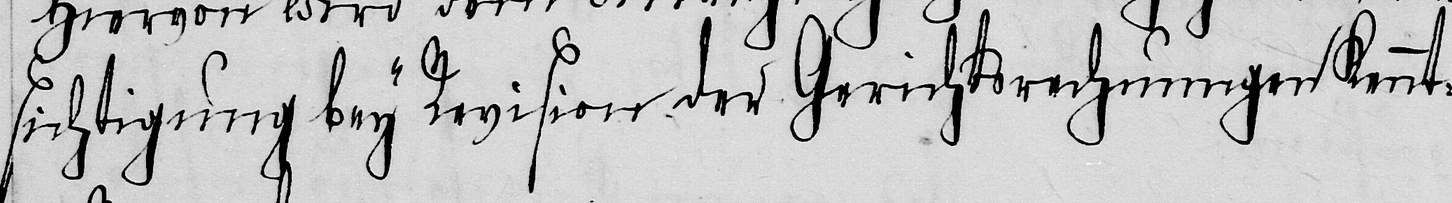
sichtigung bey Revision der Gerichtsrechnungen Kenn¬
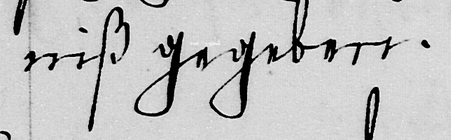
tniß gegeben.
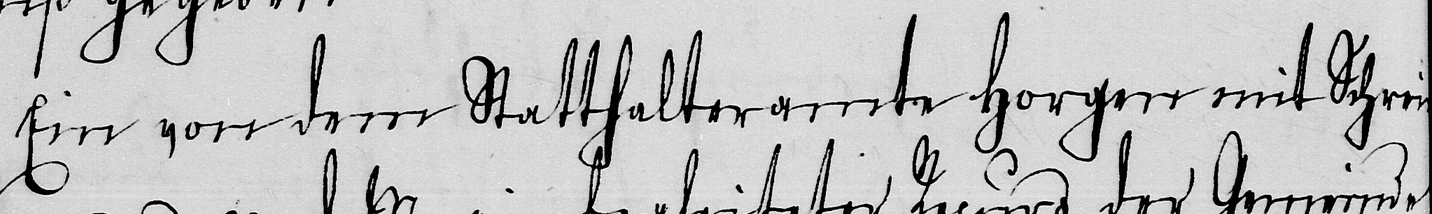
Ein von dem Statthalteramte Horgen mit Schre¬
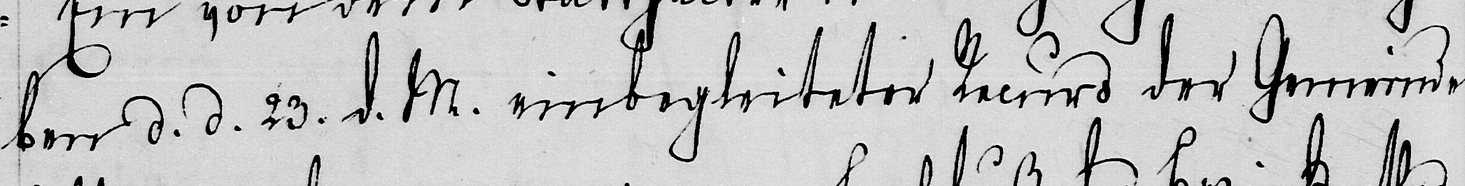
iben d. d. 23. d. M. einbegleiteter Recurs der Gemeinde
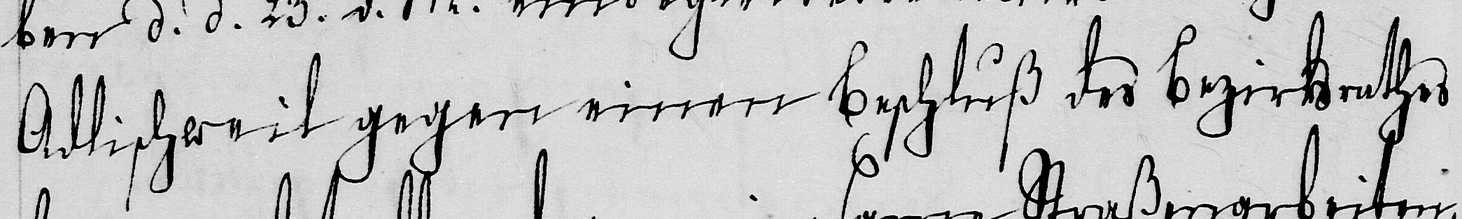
Adlischweil gegen einen Beschluß des Bezirksrathes
